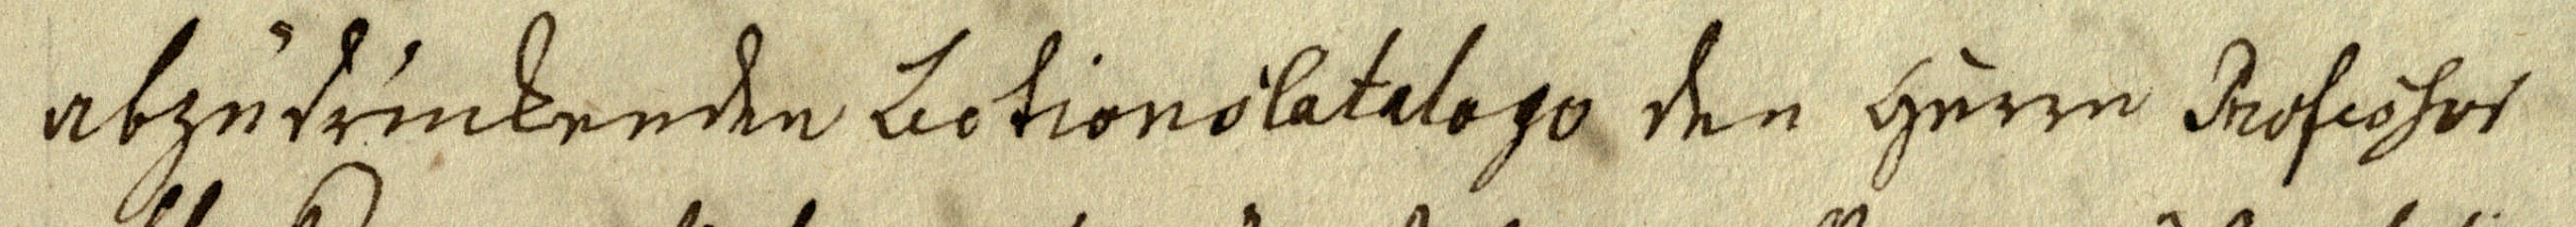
abzudruckenden LectionsCatalogo den Herrn Professor
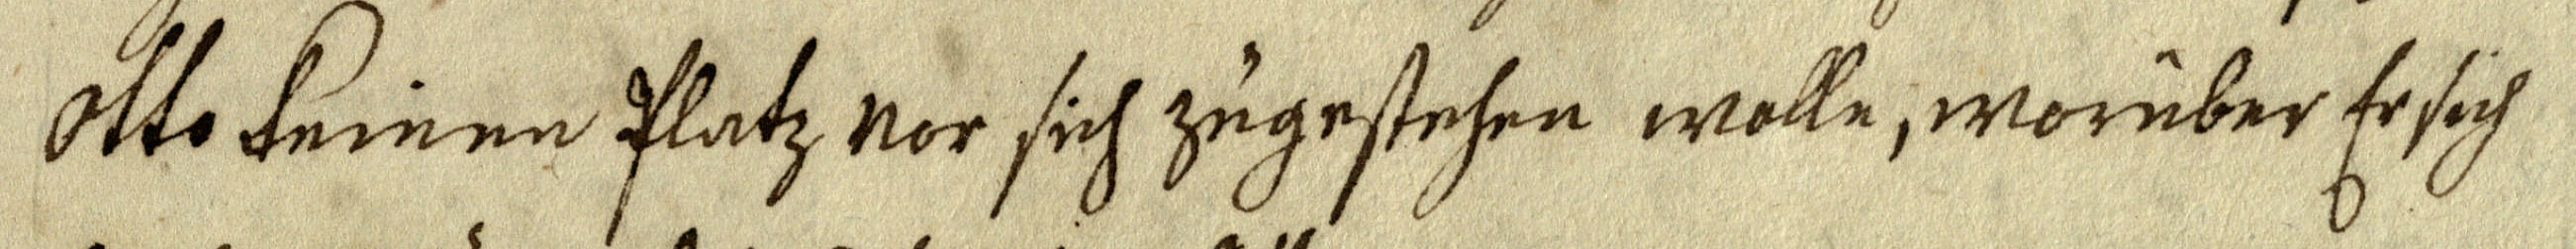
Otto keinen Platz vor sich zugestehen wolle, worüber Er sich
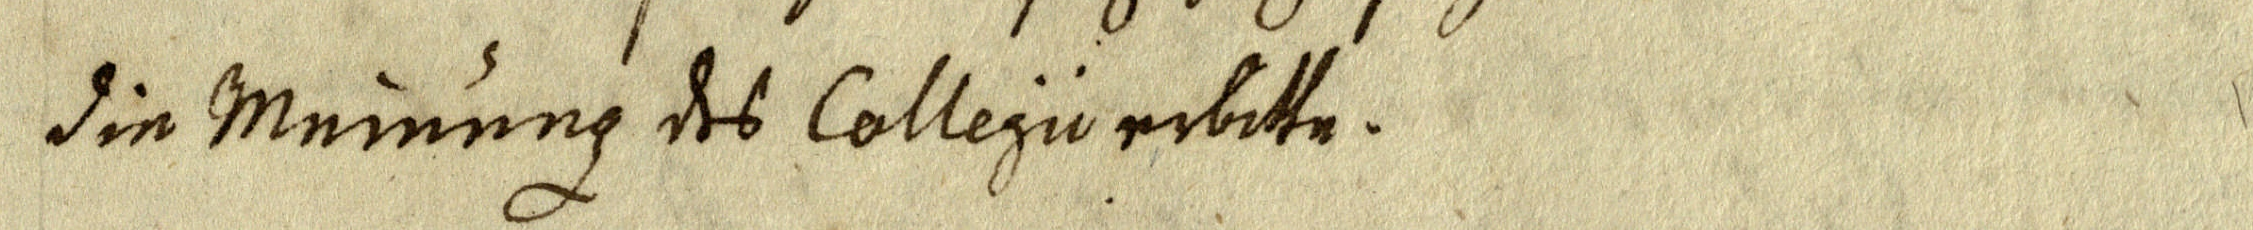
die Meinung des Collegii erbitte.
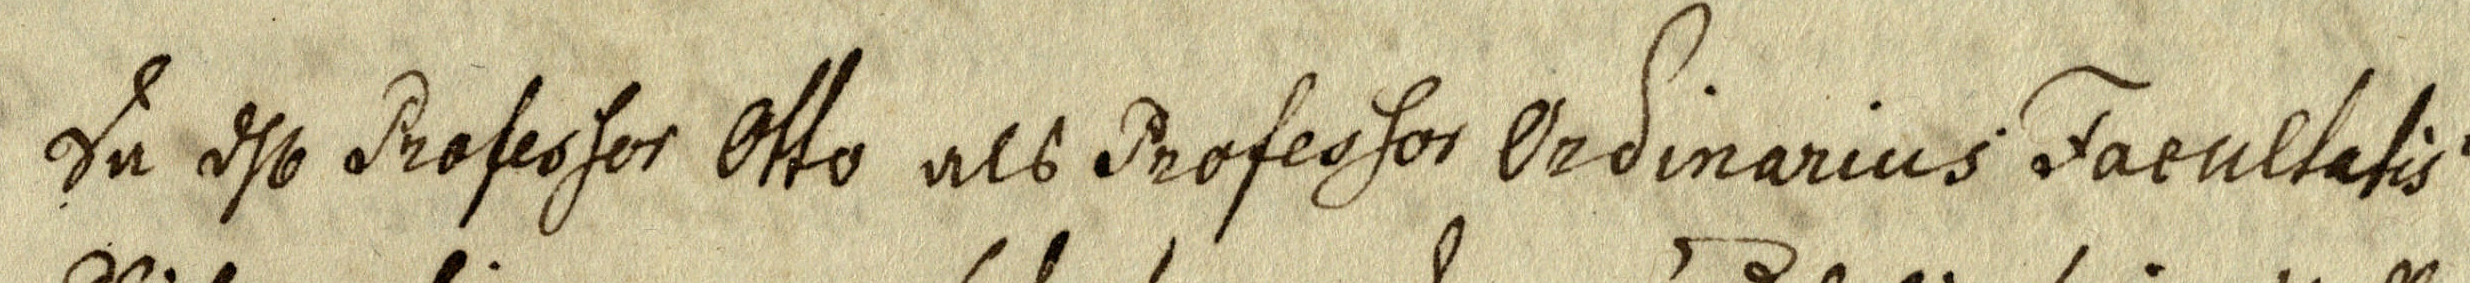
da dh Professor Otto als Professor Ordinarius Facultatis
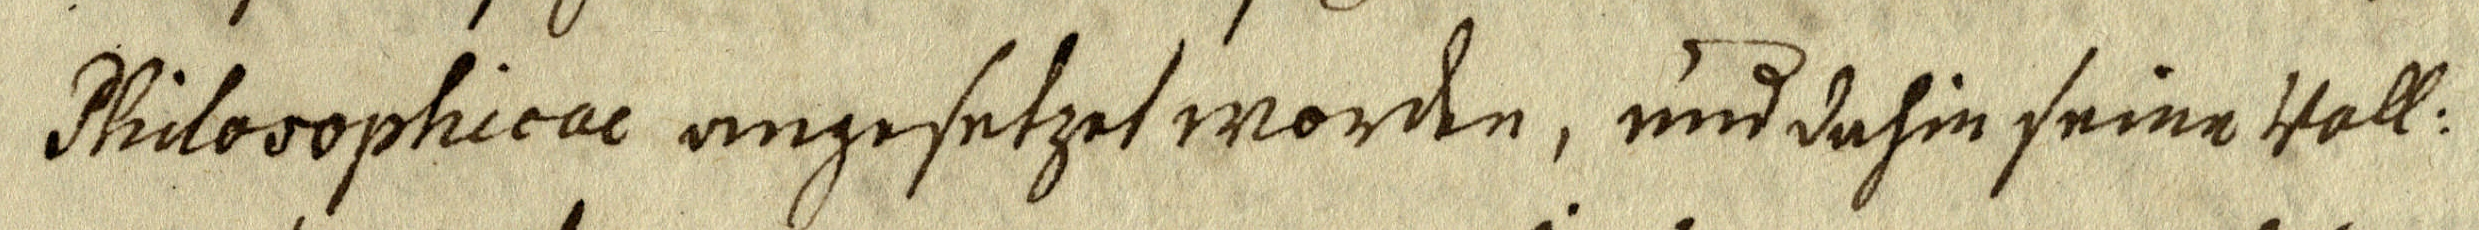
Philosophicae angesetzet worden, und dahin seine Voll¬
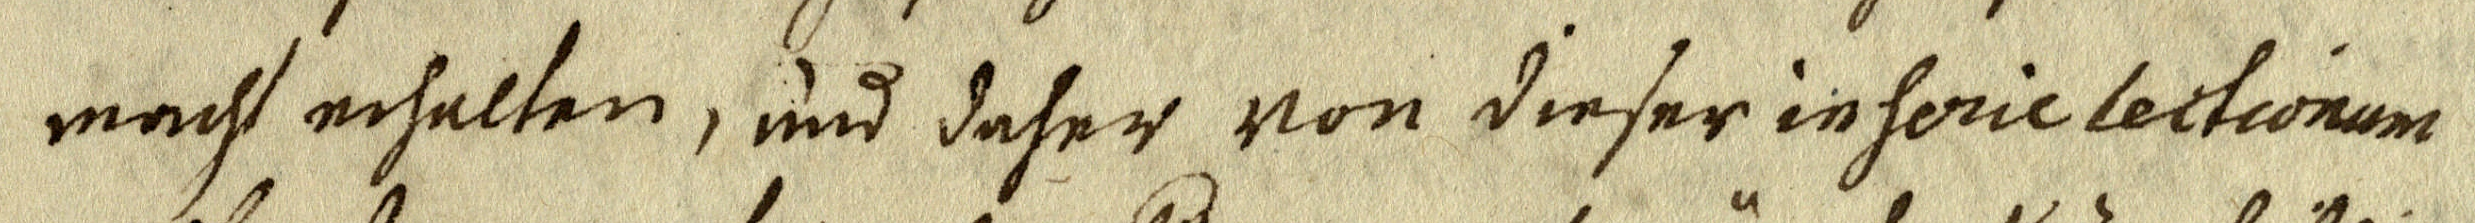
macht erhalten, und daher von dieser in serie lectionum
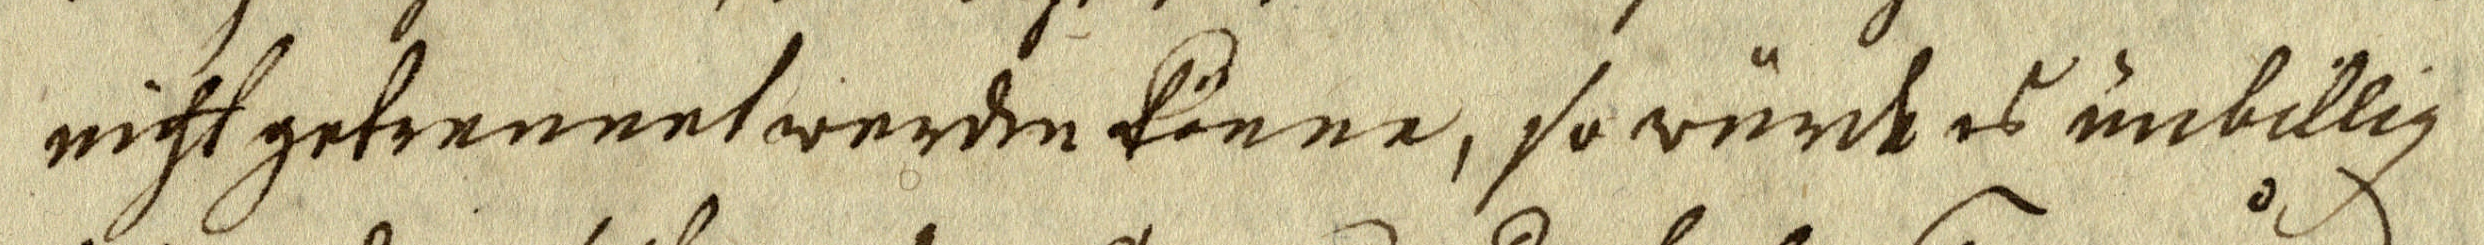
nicht getrennt werden könne, so würde es unbillig
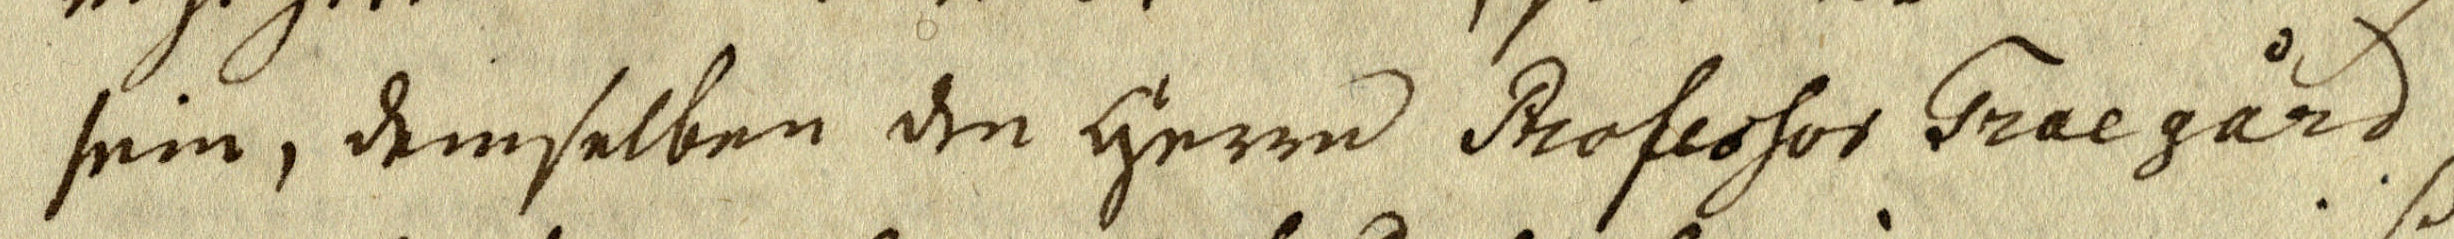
sein, demselben den Herrn Professor Traegård
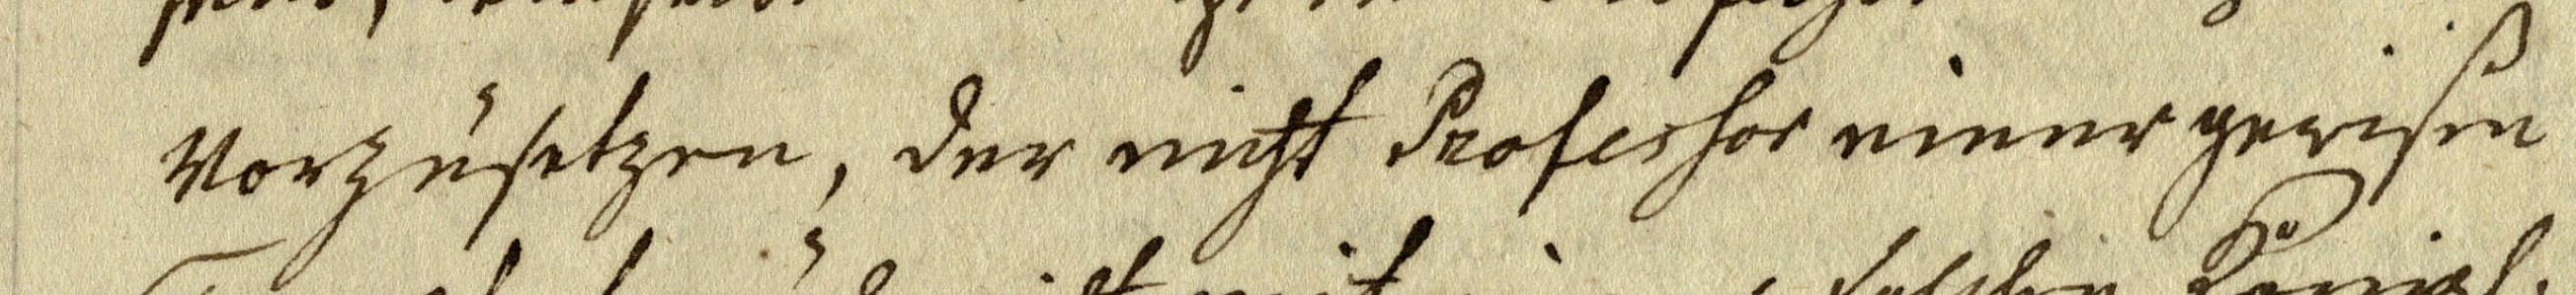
vorzusetzen, der nicht Professor einer gewißen
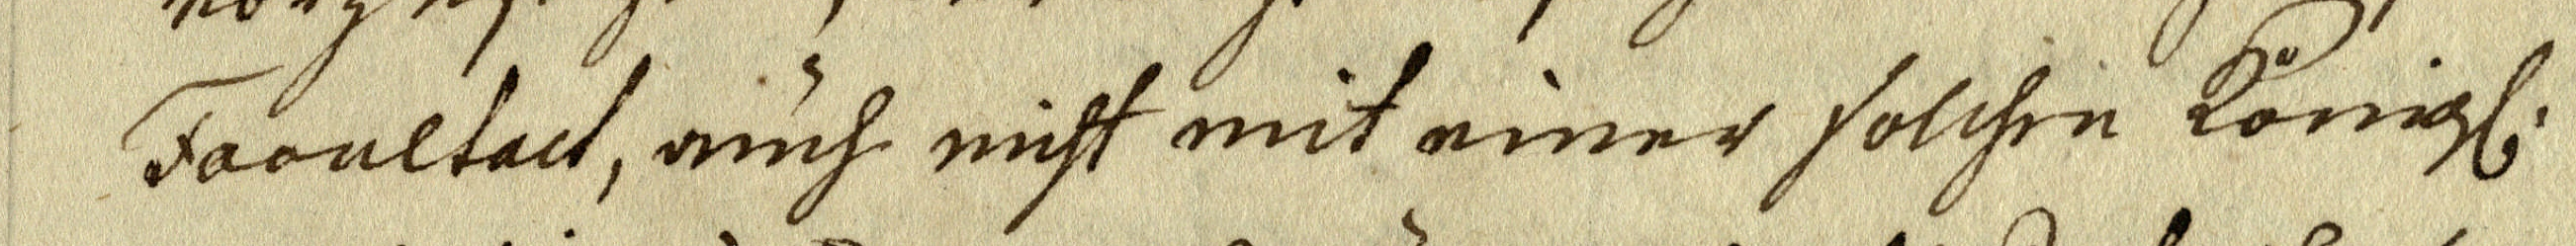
Facultaet, auch nicht mit einer solchen Königl:
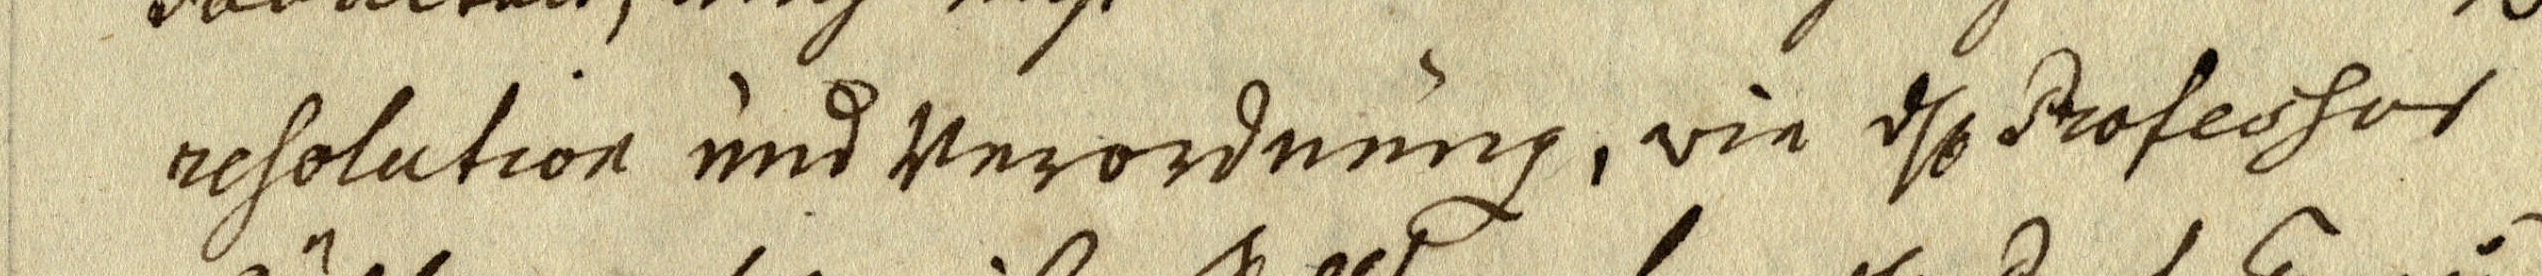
resolution und Verordnung, wie dh Professor
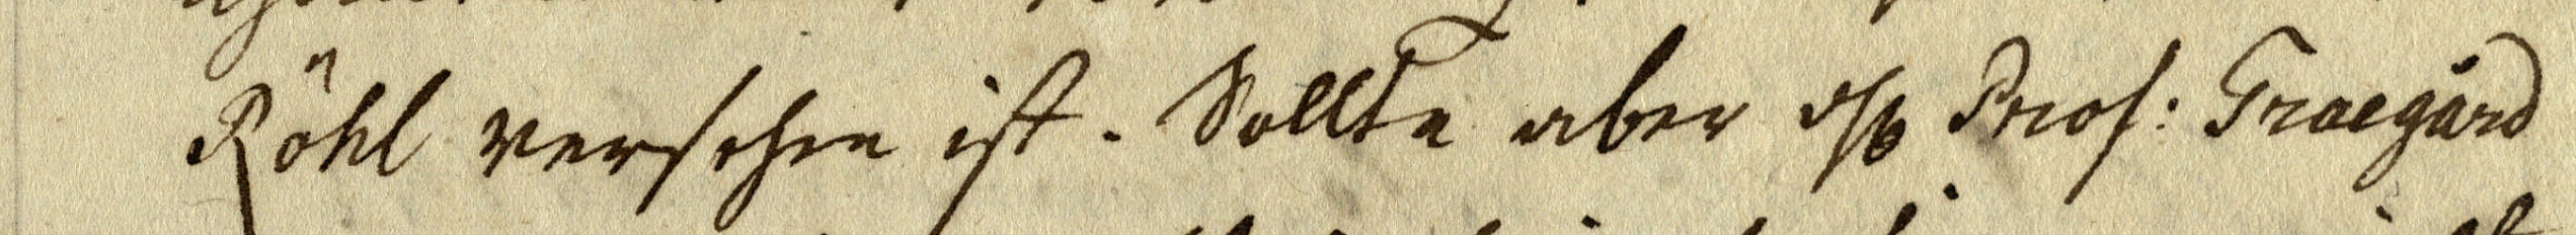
Röhl versehen ist. Sollte aber dh Prof: Traegård
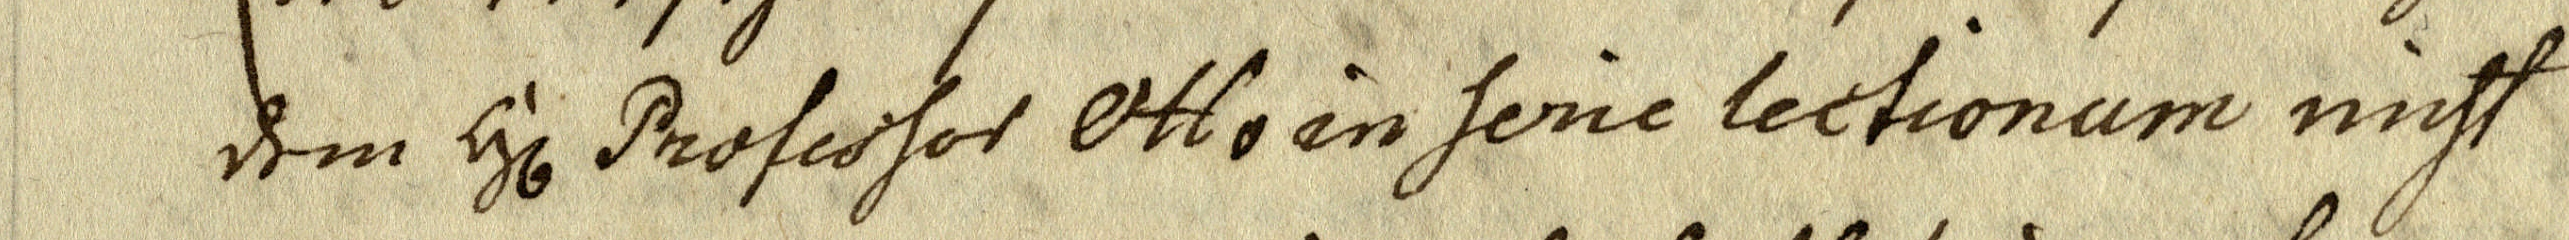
dem h Professor Otto in serie lectionum nicht
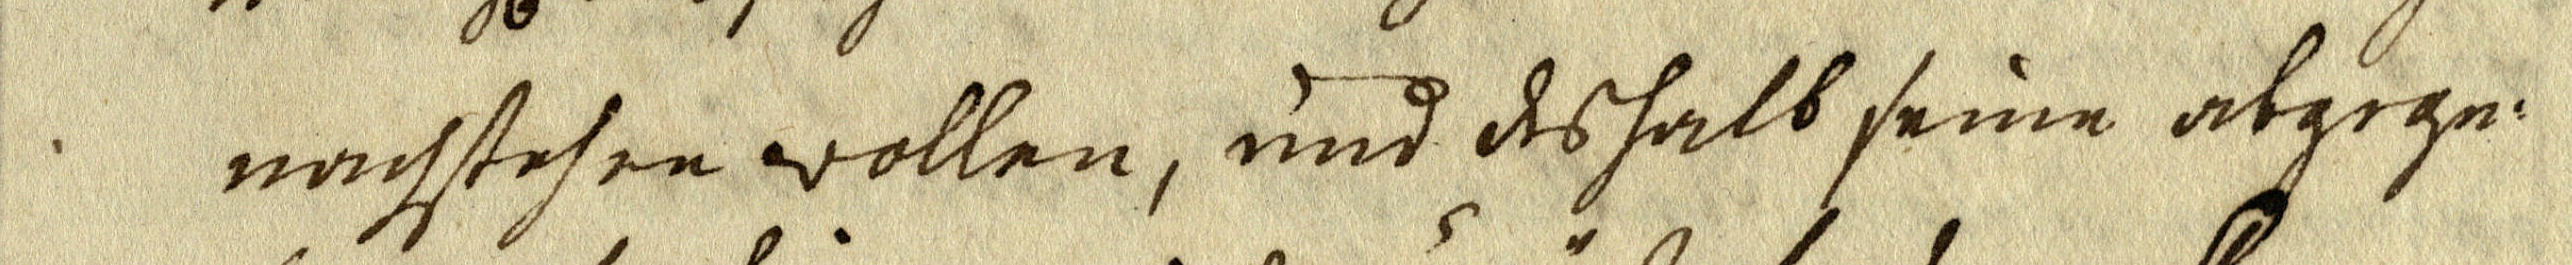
nachstehen wollen, und deshalb seine abgege¬
